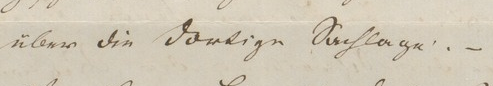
über die dortige Sachlage. –
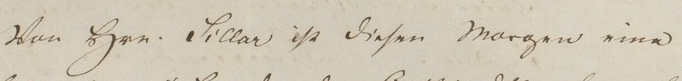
Von Hrn. Sillar ist diesen Morgen eine
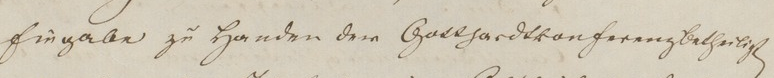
Eingabe zu Handen der Gotthardtkonferenzbetheiligten
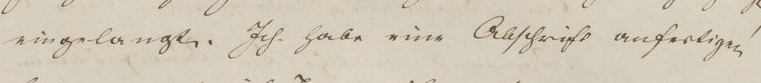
eingelangt. Ich habe eine Abschrift anfertigen
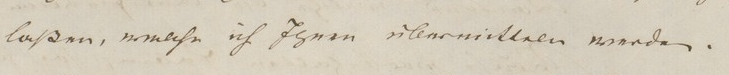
laßen, welche ich Ihnen übermitteln werde.
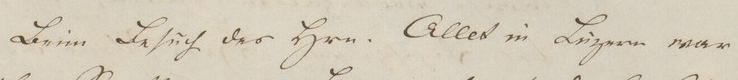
Beim Besuch des Hrn. Allet in Luzern war
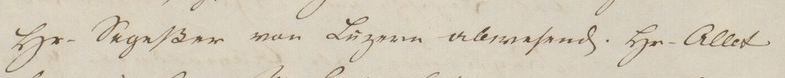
Hr. Segeßer von Luzern abwesend. Hr. Allet
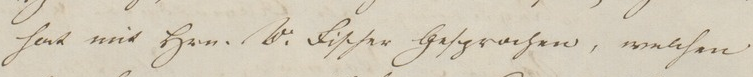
hat mit Hrn. V. Fischer gesprochen, welchen
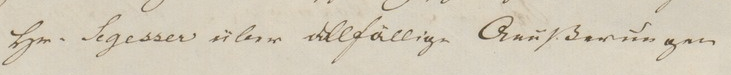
Hr. Segesser über allfällige Aeußerungen
